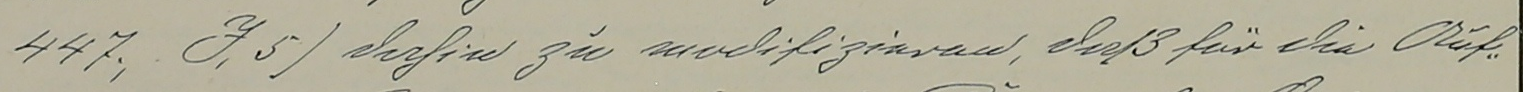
447; I.5) dahin zu modifizieren, daß für die Auf-
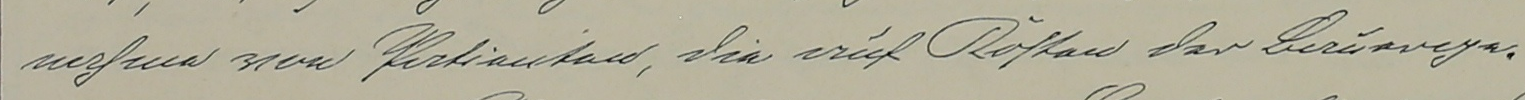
nahme von Patienten, die auf Kosten der Bauerge-
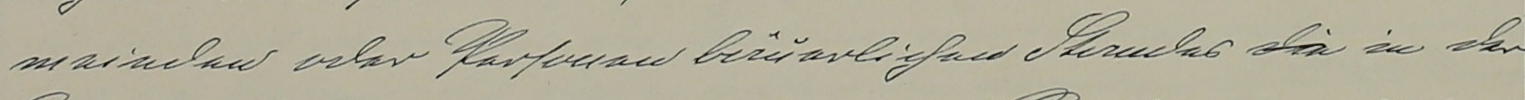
meinden oder Personen bäuerlichen Standes die in der
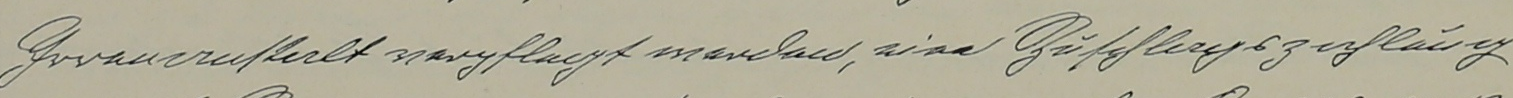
Irrenanstalt verpflegt werden, eine Zuschlagszahlung
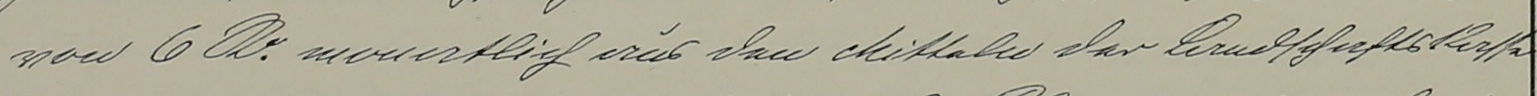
von 6 Ro. monatlich aus den Mitteln der Landschaftskasse
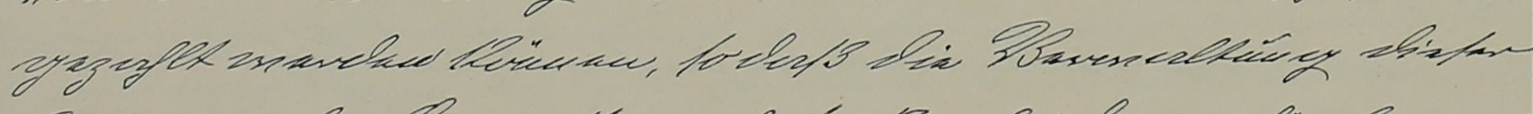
gezahlt werden können, so daß die Verwaltung dieser
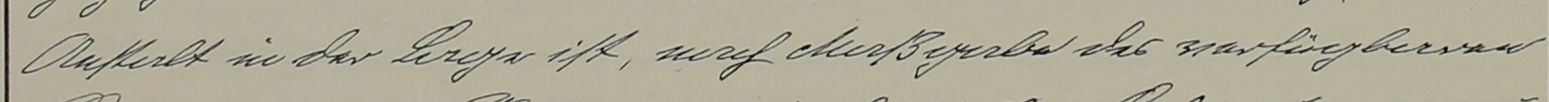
Anstalt in der Lage ist, nach Maßgabe des verfügbaren
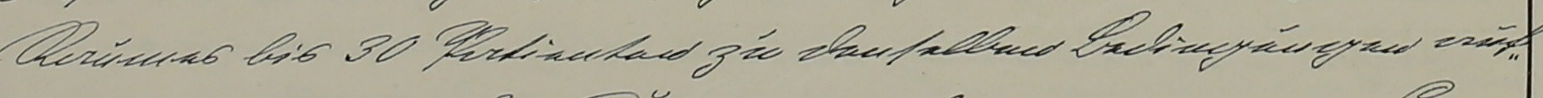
Raumes bis 30 Patienten zu den selben Bedingungen auf-
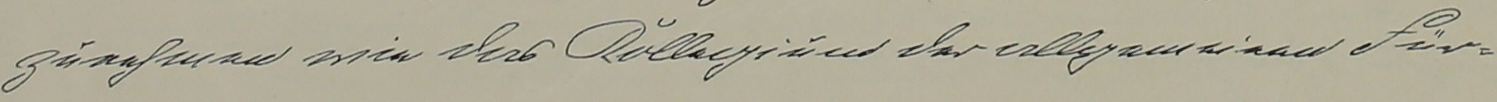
zunehmen wie das Kollegium der Allgemeinen Für-
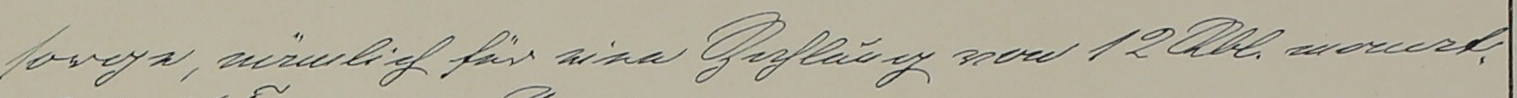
sorge, nämlich für eine Zahlung von 12 Rbl. monat-
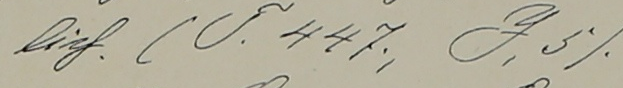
lich. (T. 447; I.5).
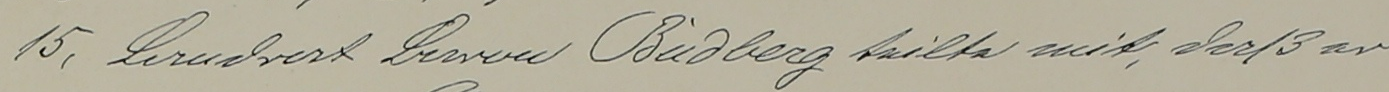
15. Landrat Baron Budberg teilte mit, daß er
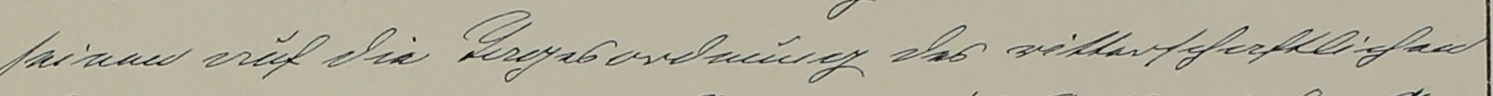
seinen auf die Tagesordnung des ritterschaftlichen
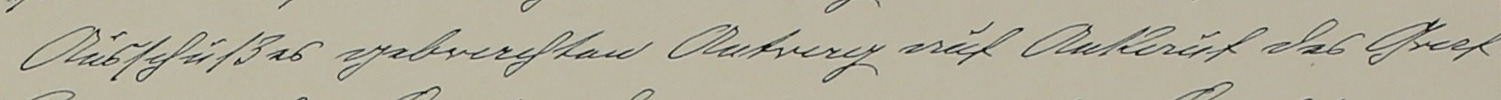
Ausschußes gebrachten Antrag auf Ankauf des Graf
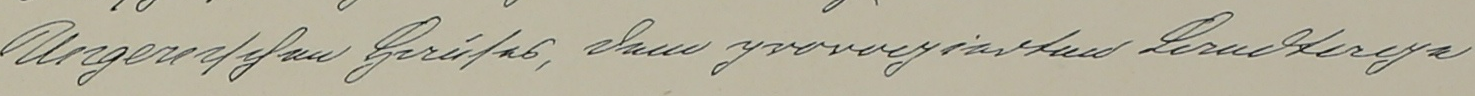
Ungernschen Hauses, dem prorogierten Landtage
